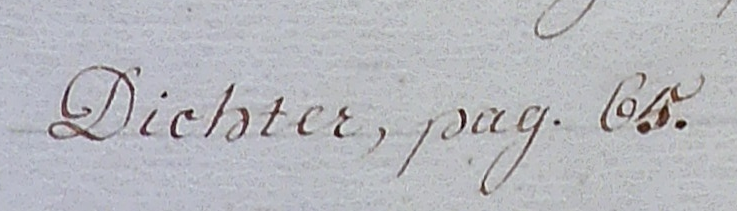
Dichter, pag. 65.
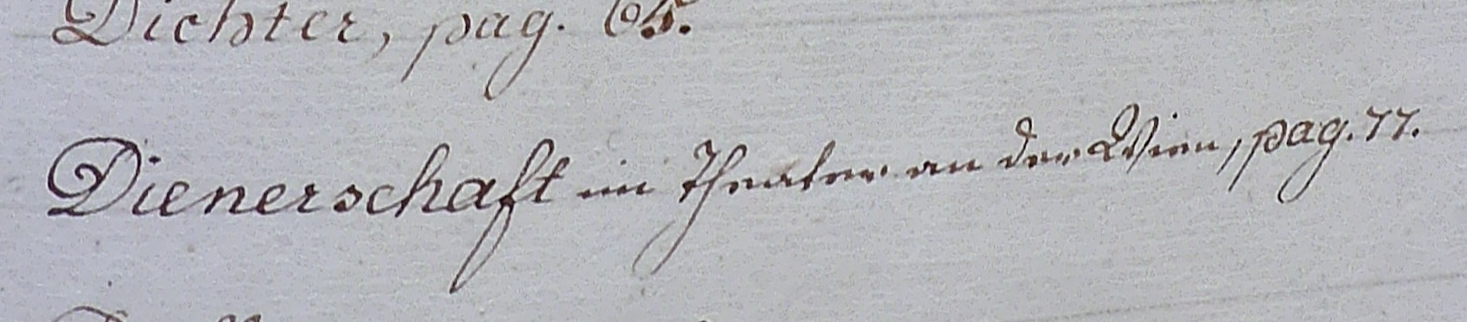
Dienerschaft im Theater an der Wien, pag. 77.
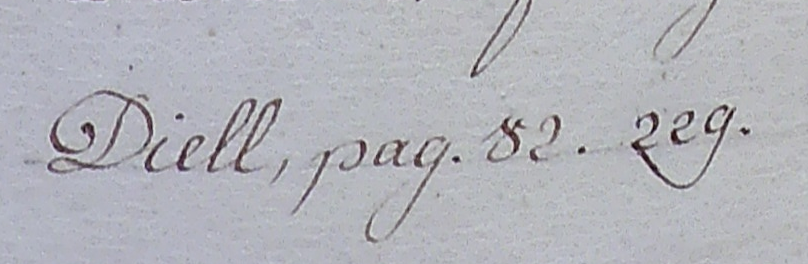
Diell, pag. 82. 229.
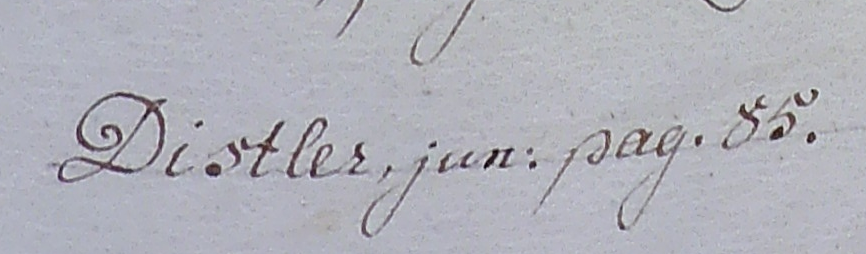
Distler, jun: pag. 85.
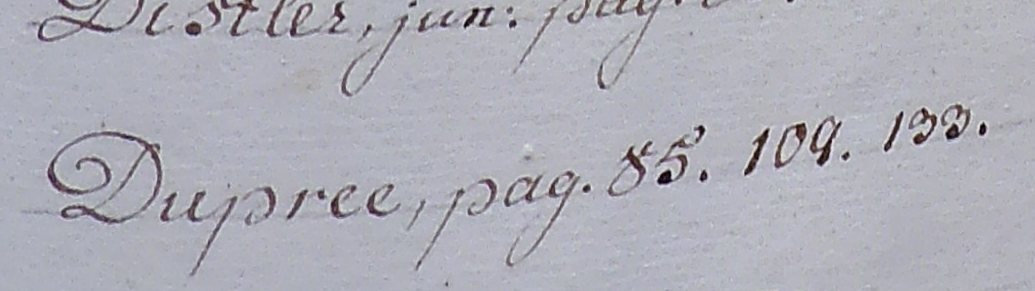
Dupree, pag. 85. 109. 133.
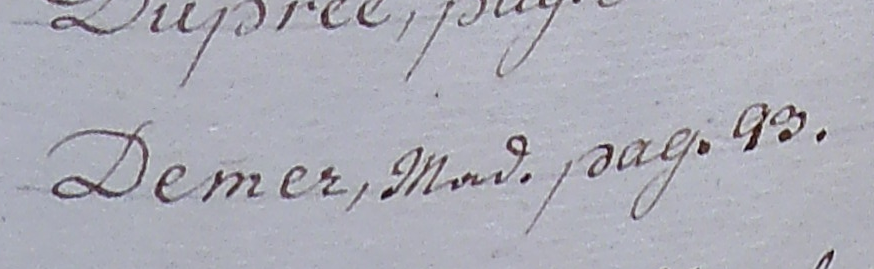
Demer, Mad. pag. 93.
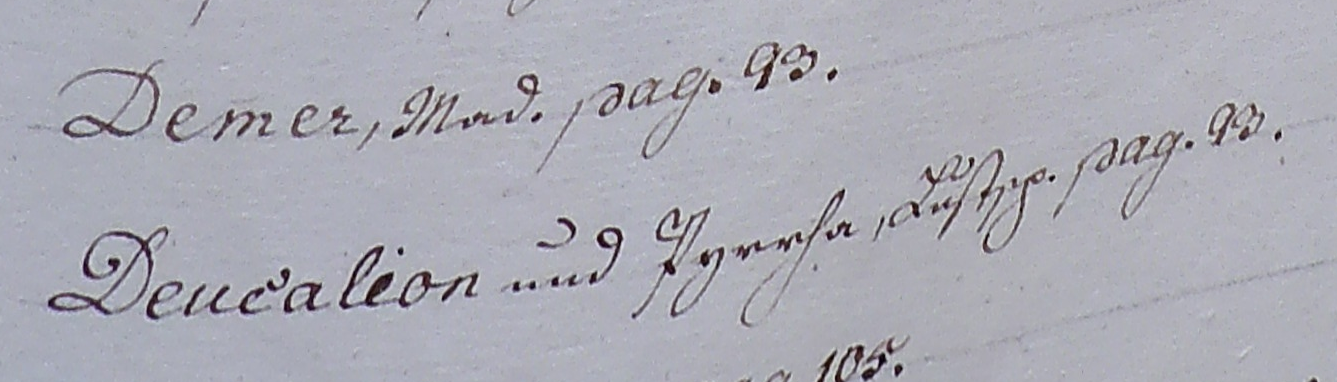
Deucalion und Pyrrha, Lustsp. pag. 93..
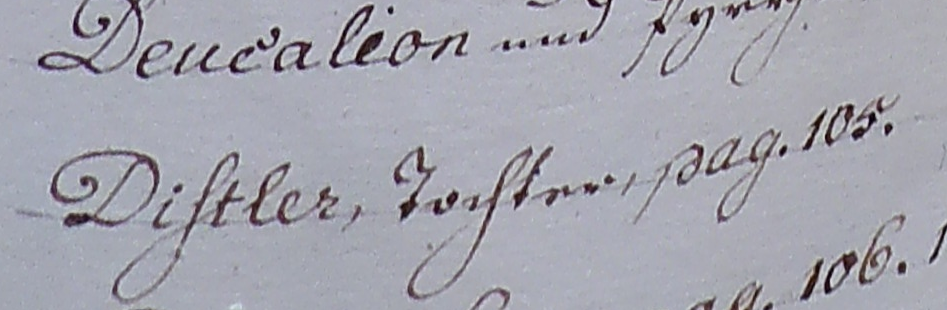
Distler, Tochter, pag. 105.
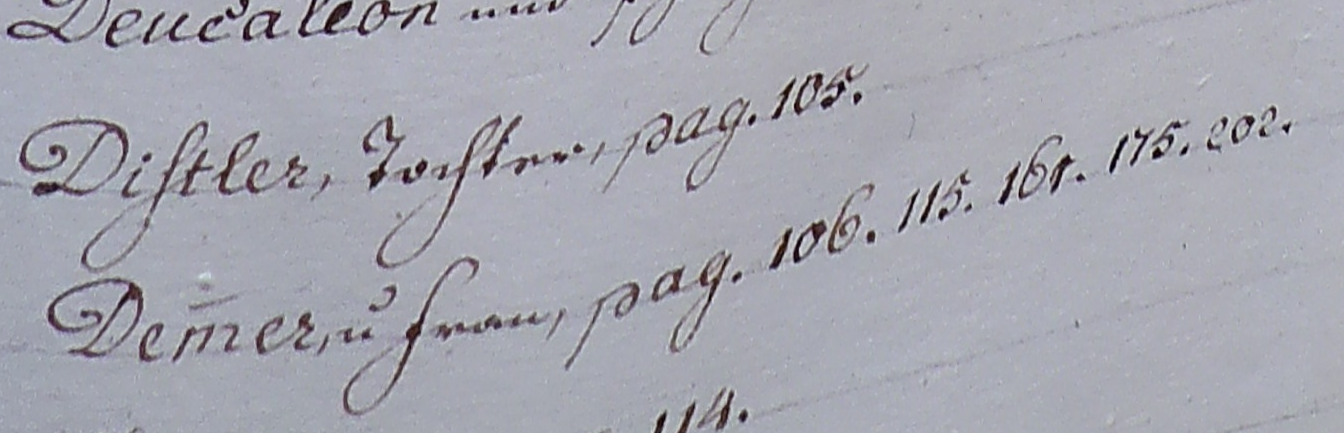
Dem̅er, u Frau, pag. 106. 115. 161. 175. 202.
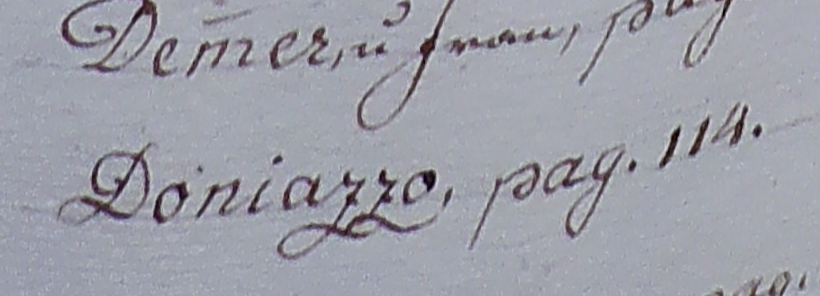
Doniazzo, pag. 114.
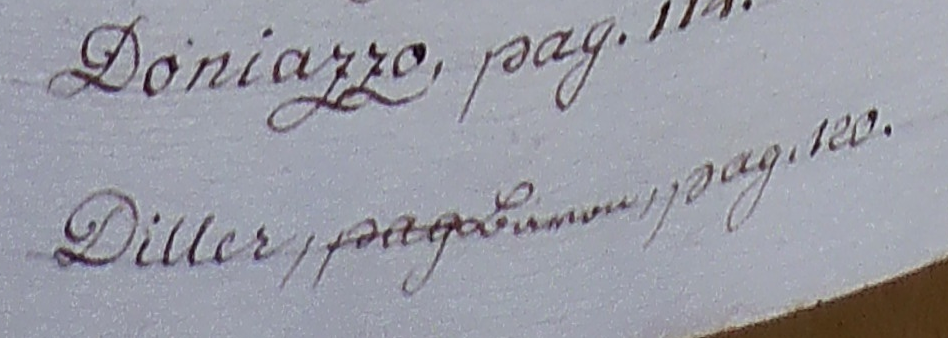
Diller, pagBaron, pag. 120.
